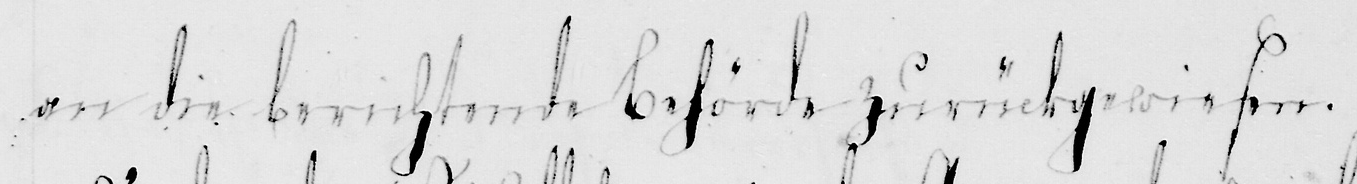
an die berichtende Behörde zurückgewiesen.
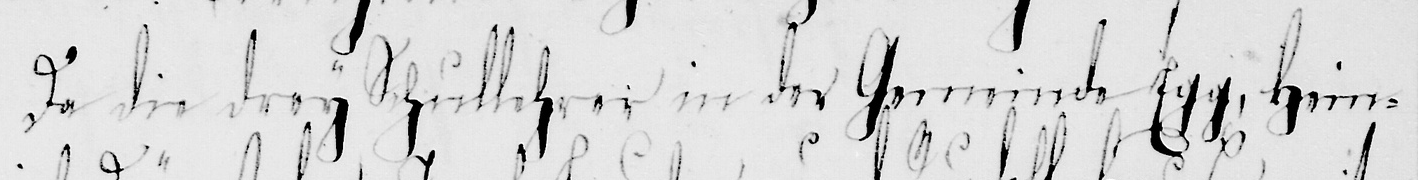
Da die drey Schullehrer in der Gemeinde Egg, Hein¬
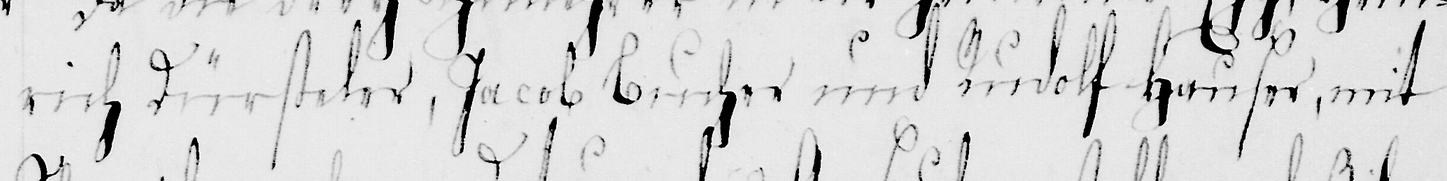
rich Dürsteler, Jacob Bucher und Rudolf Hauser, mit
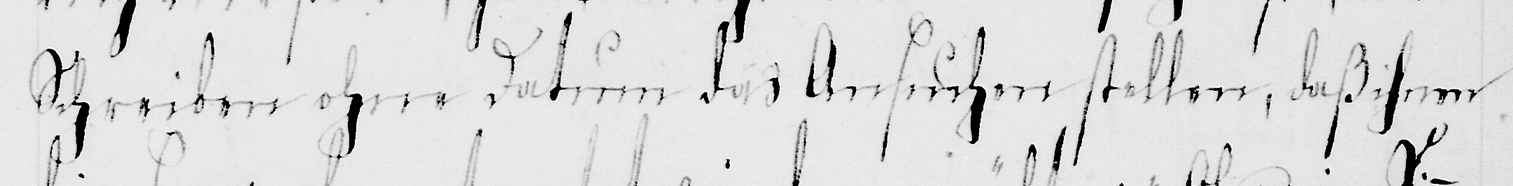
Schreiben ohne Datum das Ansuchen stellen, daß ihnen
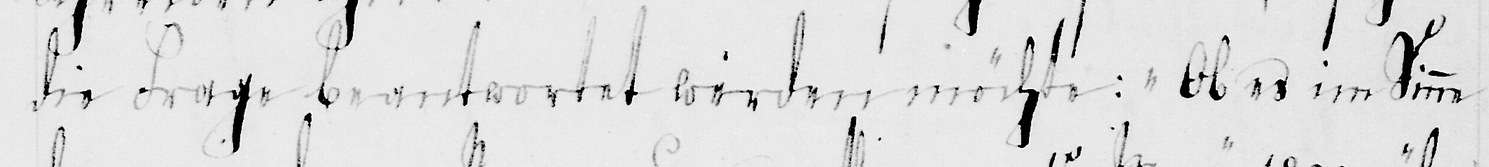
die Frage beantwortet werden möchte: „Ob es im Sinne
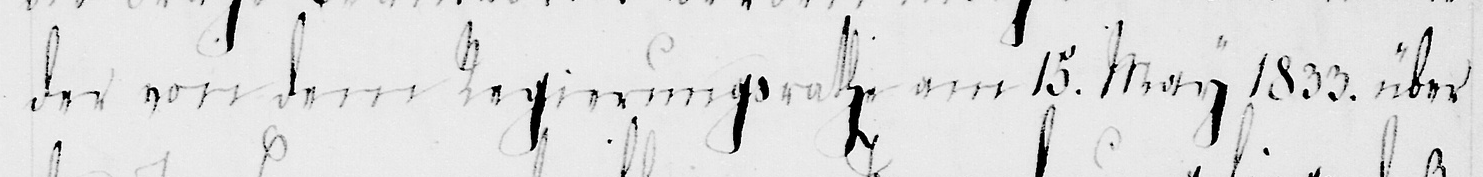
der von dem Regierungsrathe am 15. März 1833. über
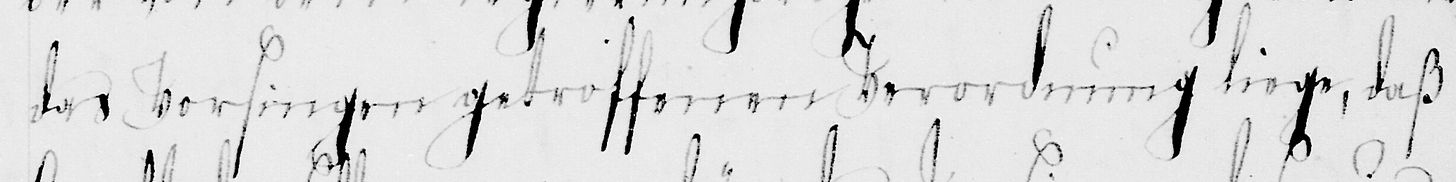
das Vorsingen getroffenen Verordnung liege, daß
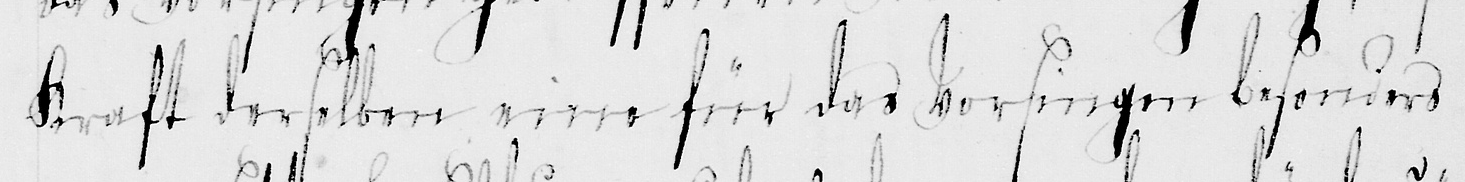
Kraft derselben eine für das Vorsingen besonders
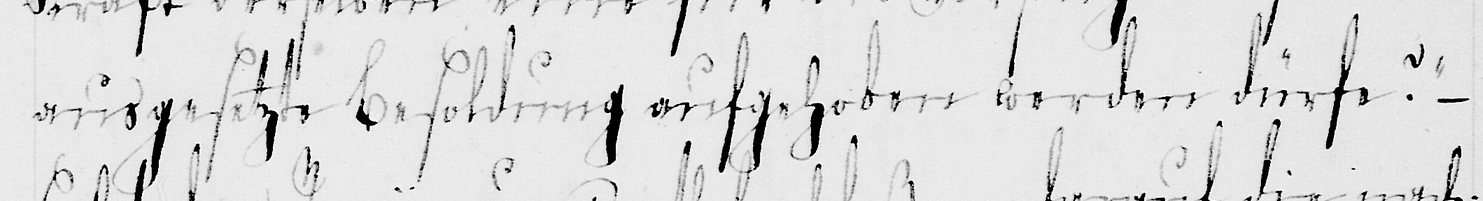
ausgesetzte Besoldung aufgehoben werden dürfe?“
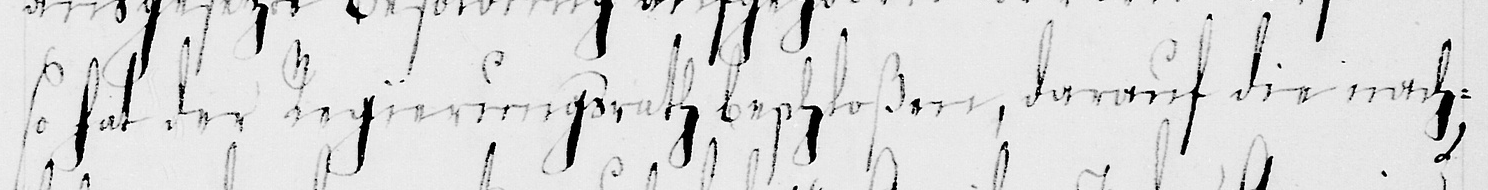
so hat der Regierungsrath beschloßen, darauf die nach¬
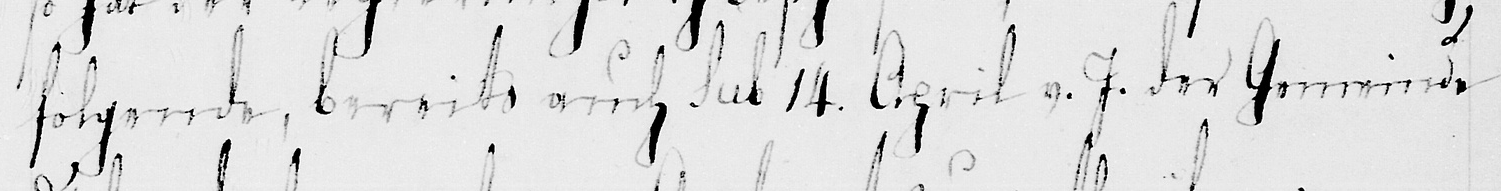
folgende, bereits auch sub. 14. April v. J. der Gemeinde
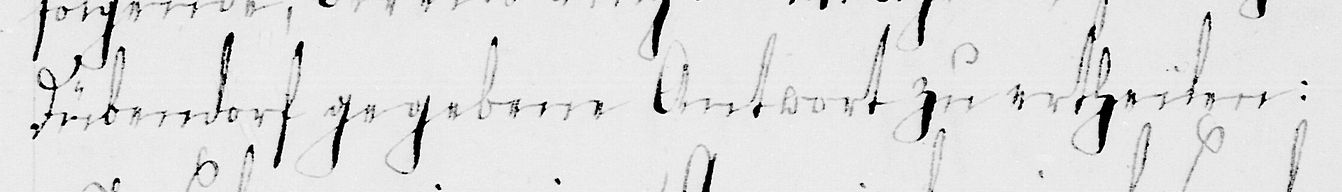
Dübendorf gegebene Antwort zu ertheilen:
